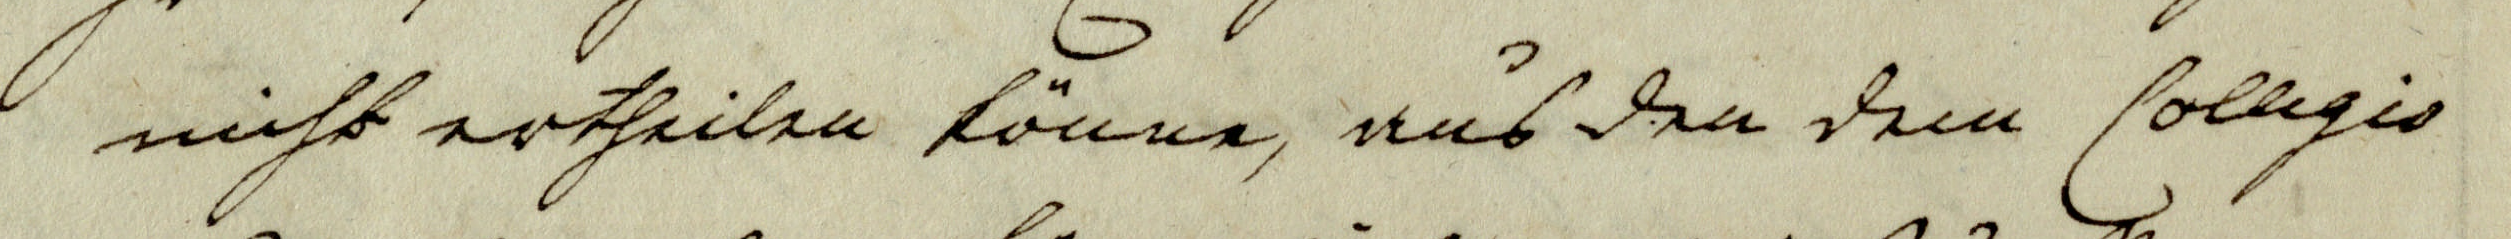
nicht ertheilen könne, aus den dem Collegio
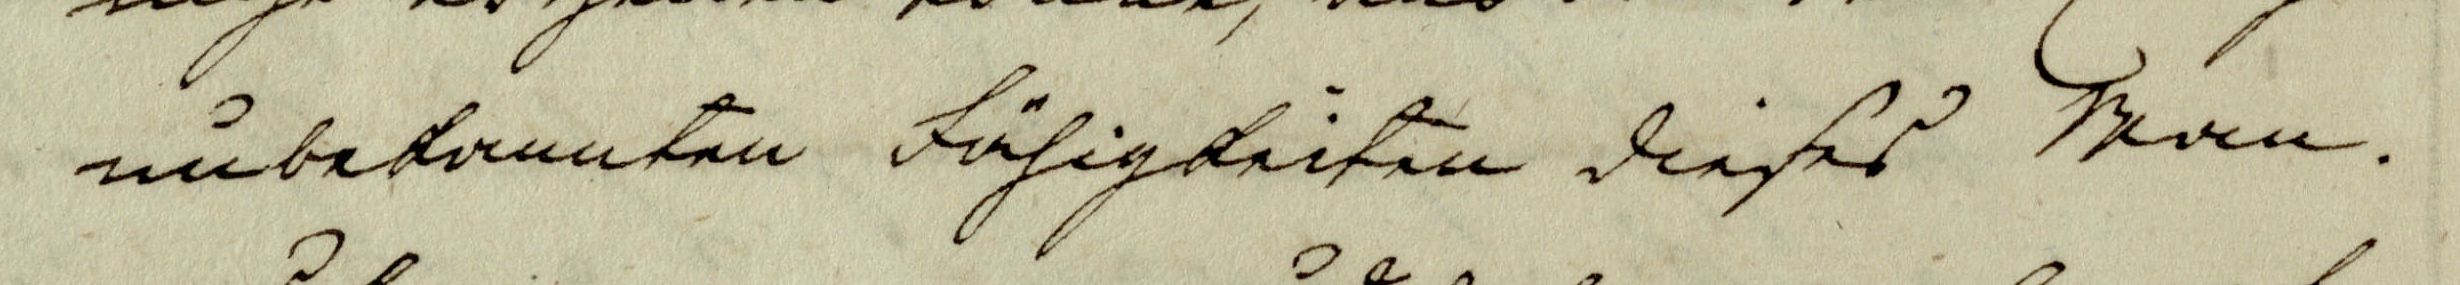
unbekannten Fähigkeiten dieses Man¬
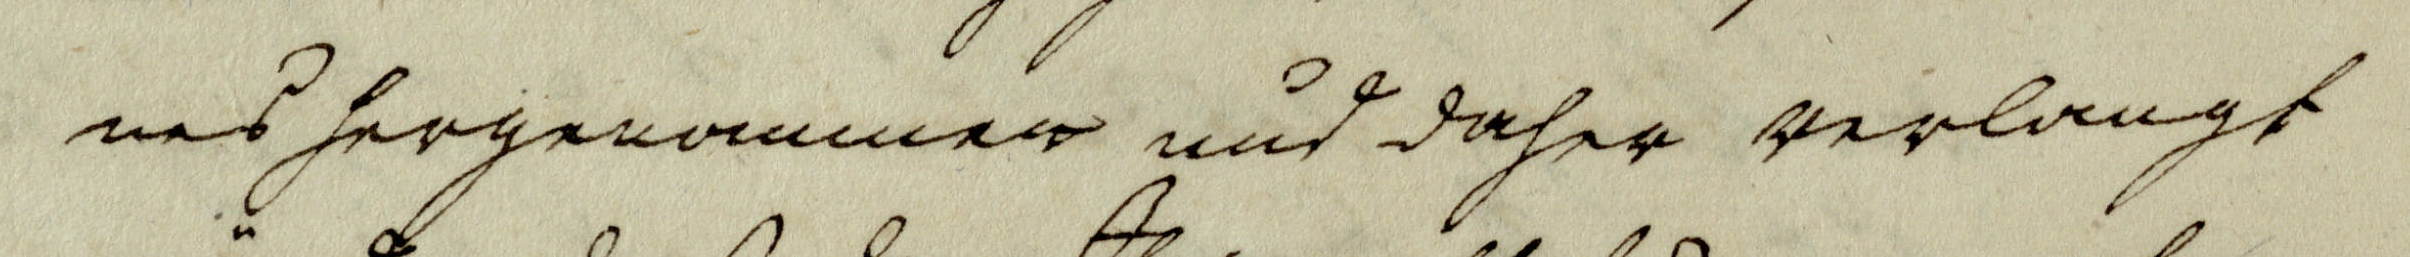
nes hergenommen und daher verlangt
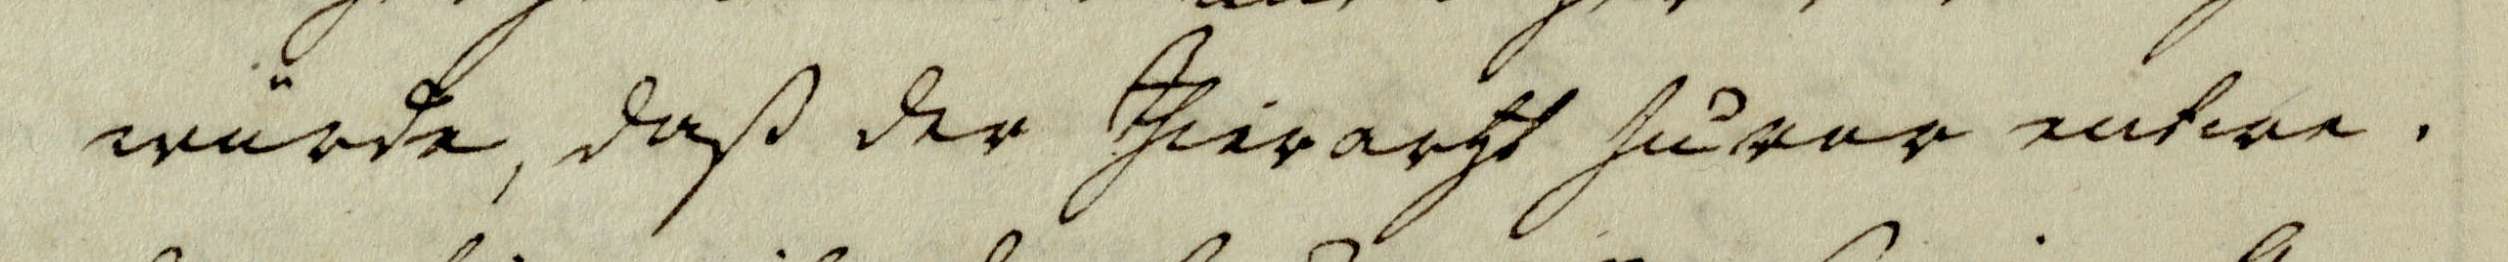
würde, daß der Thierartzt zuvor entwe¬
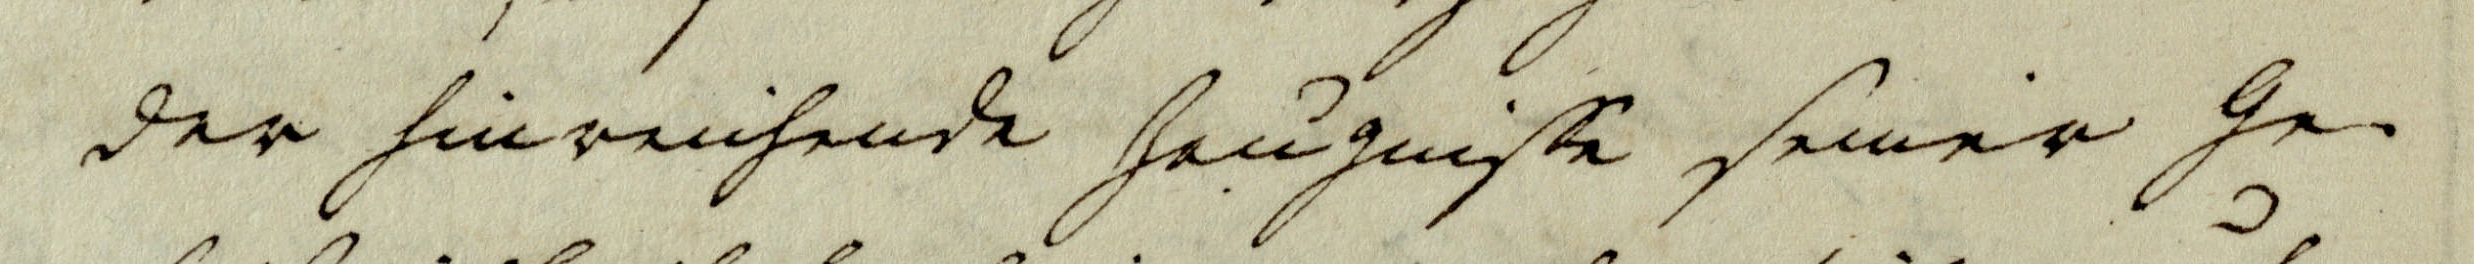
der hinreichende Zeugnisse seiner Ge¬
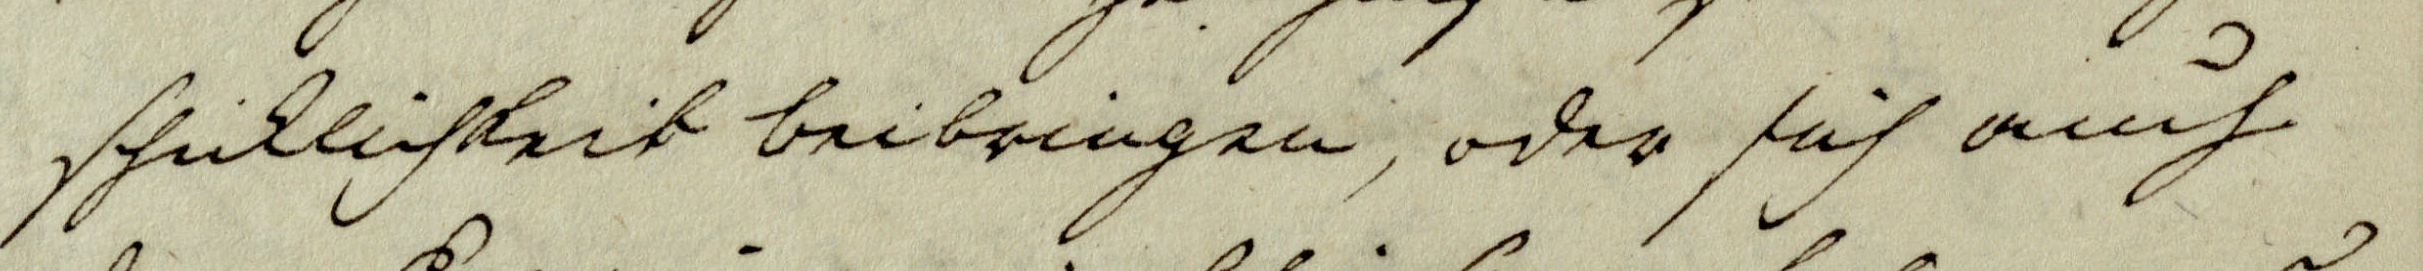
schicklichkeit beibringen, oder sich auch
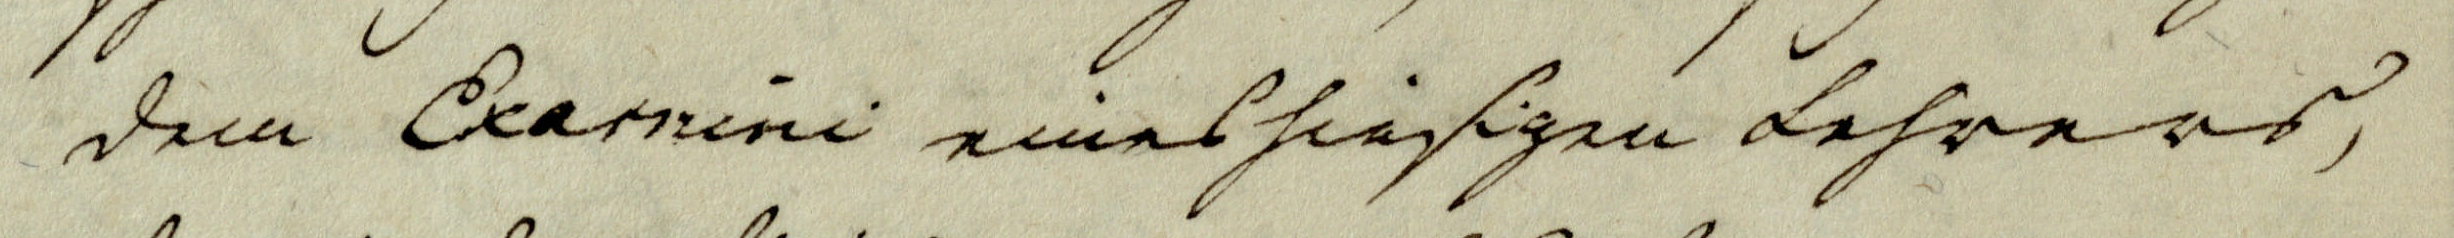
dem Examini eines hiesigen Lehrers,
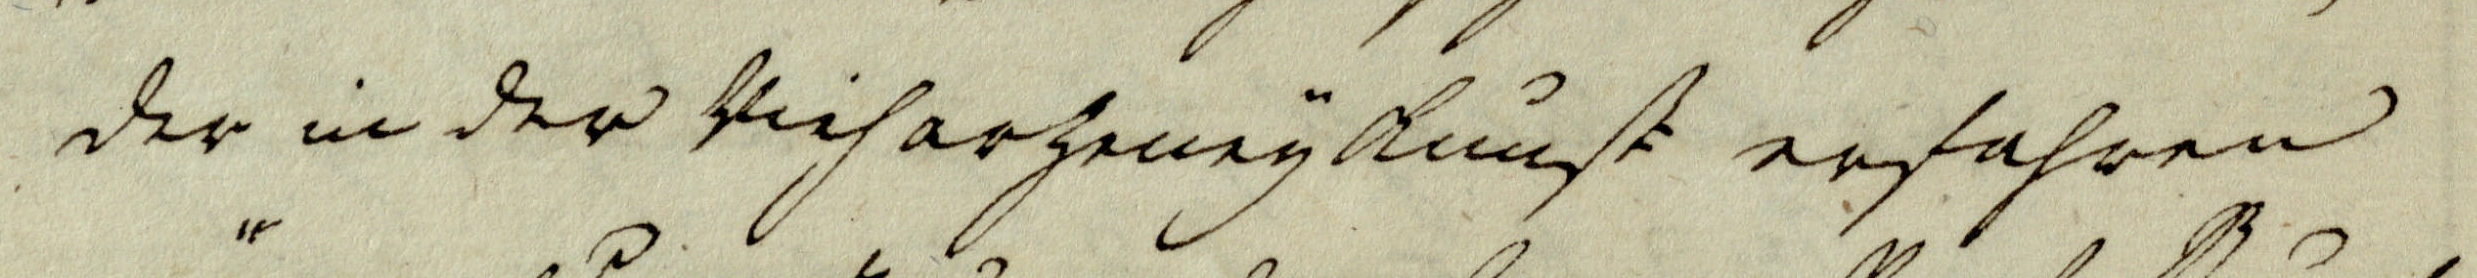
der in der Vieharzeneÿkunst erfahren
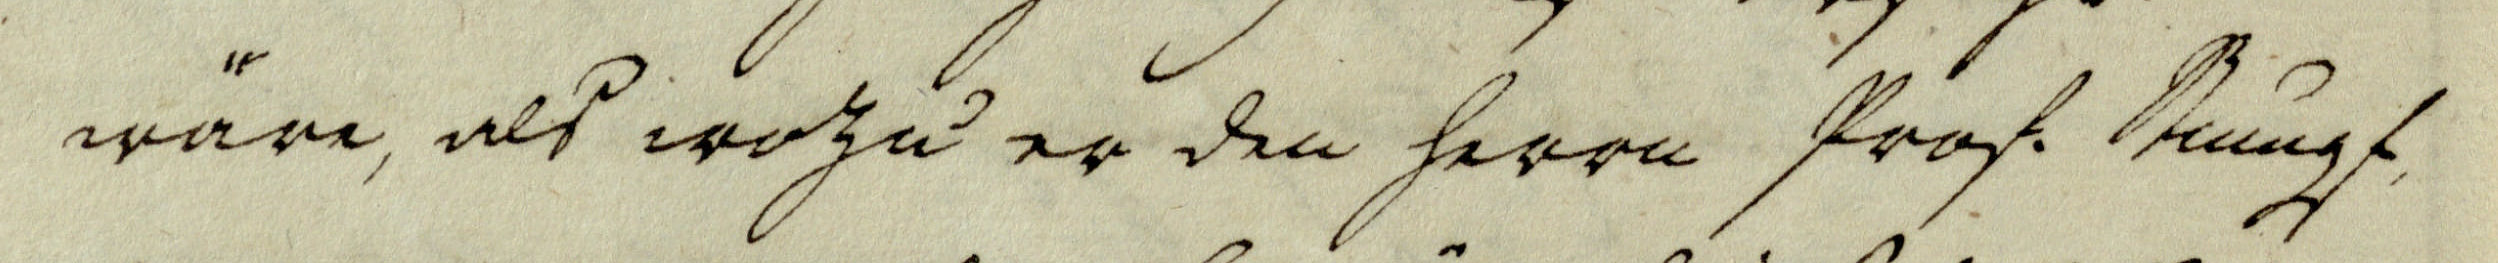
wäre, als wozu er den Herrn Prof. Stumpf
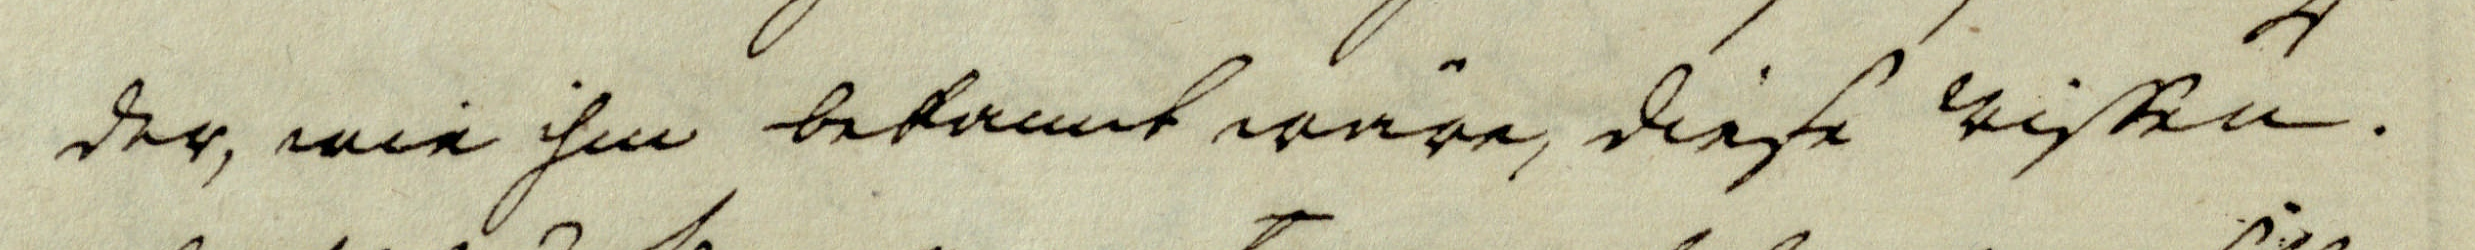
der, wie ihm bekannt wäre, diese Wissen¬
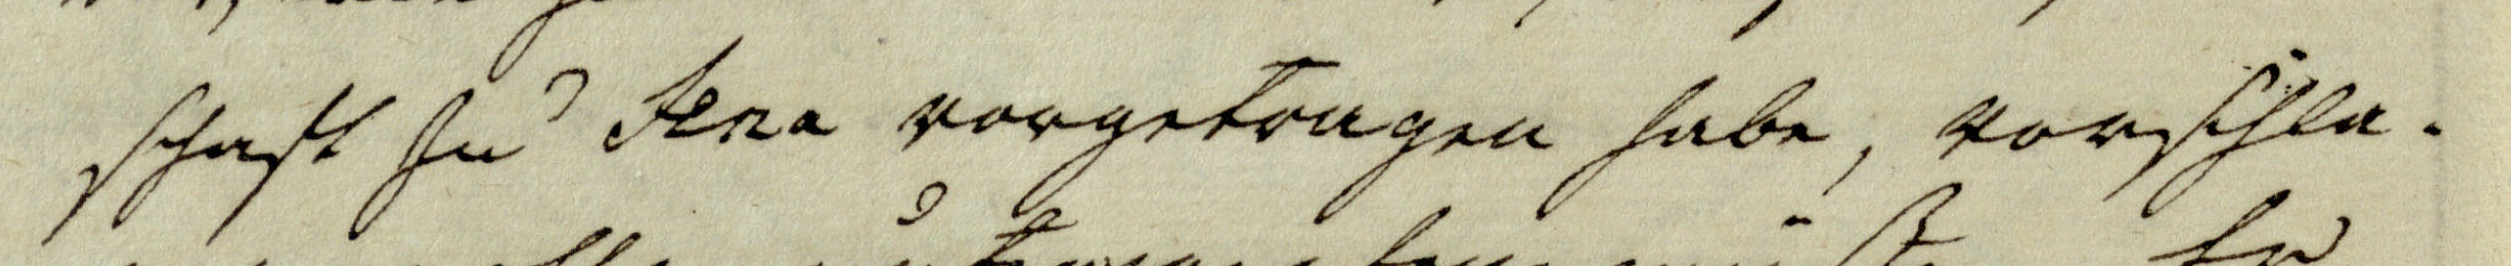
schaft zu Jena vorgetragen habe, vorschla¬
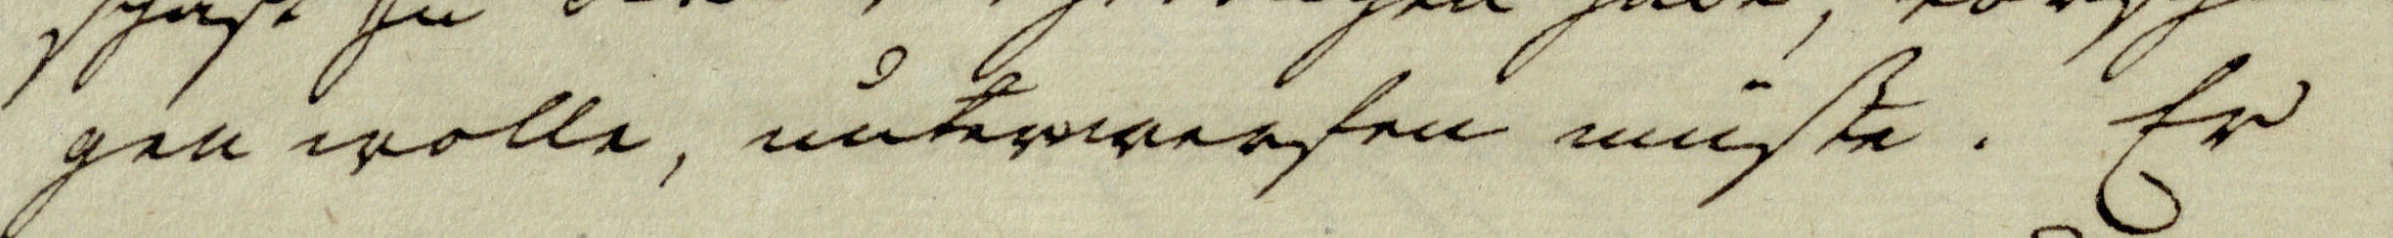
gen wolle, unterwerfen müßte. Er
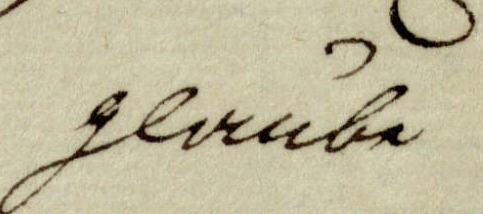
glaube
